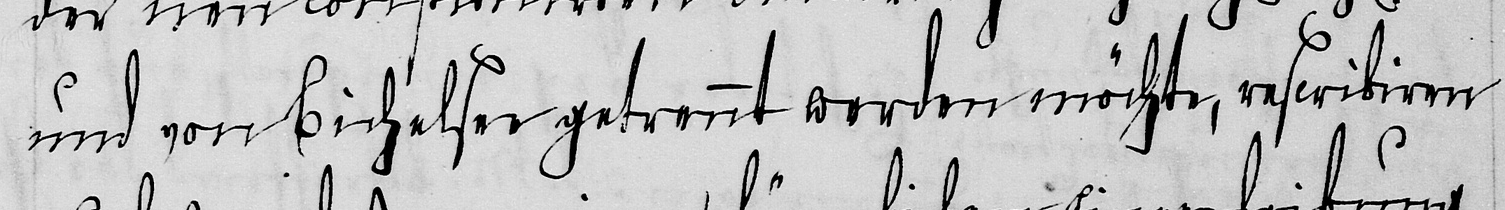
und von Bichelsee getrennt werden möchte, rescribiren
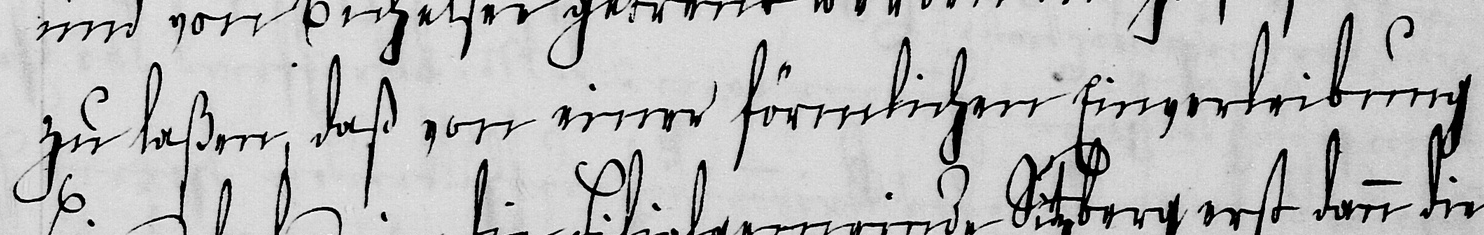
zu laßen, daß von einer förmlichen Einverleibung
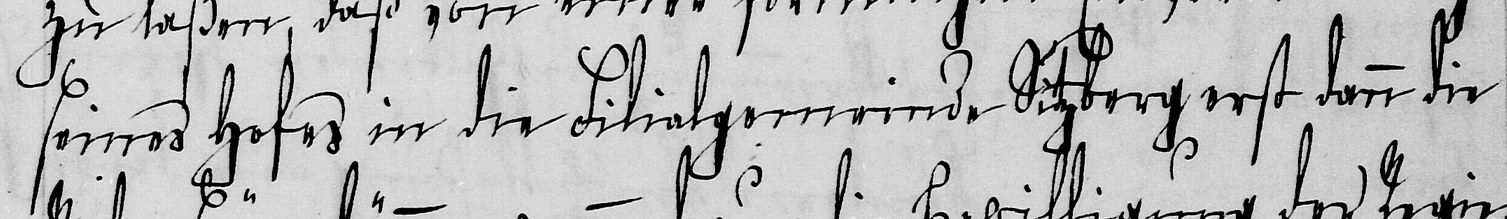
seines Hofes in die Filialgemeinde Sitzberg erst dann die
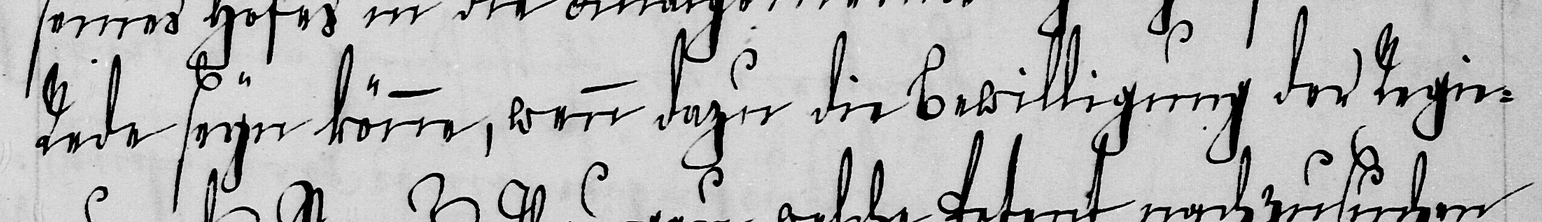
Rede seyn könne, wenn dazu die Bewilligung der Regie¬
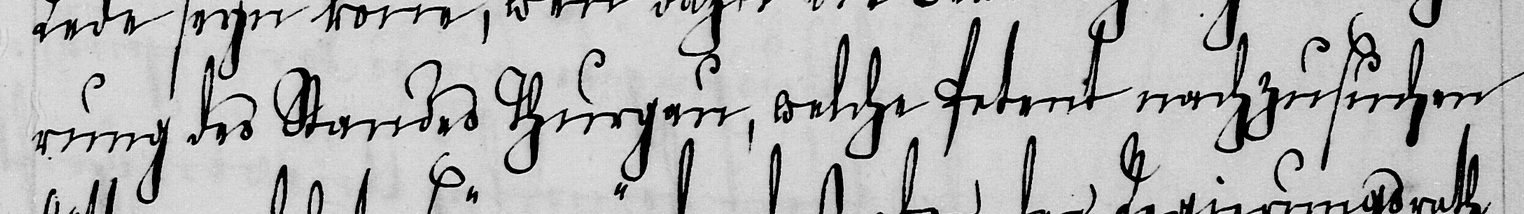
rung des Standes Thurgau, welche Petent nachzusuchen
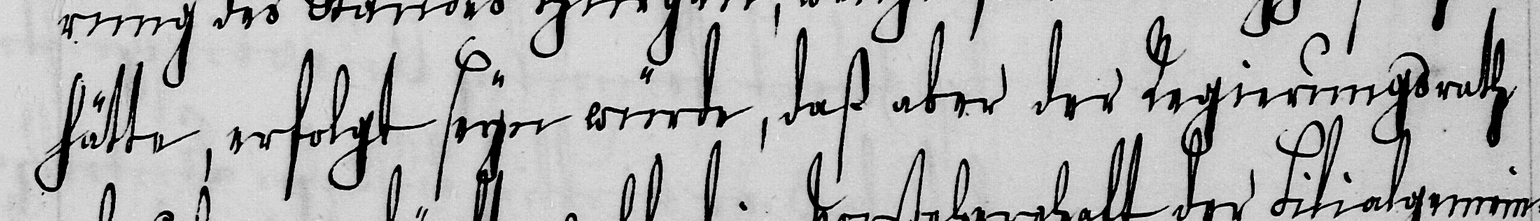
hätte, erfolgt seyn würde, daß aber der Regierungsrath
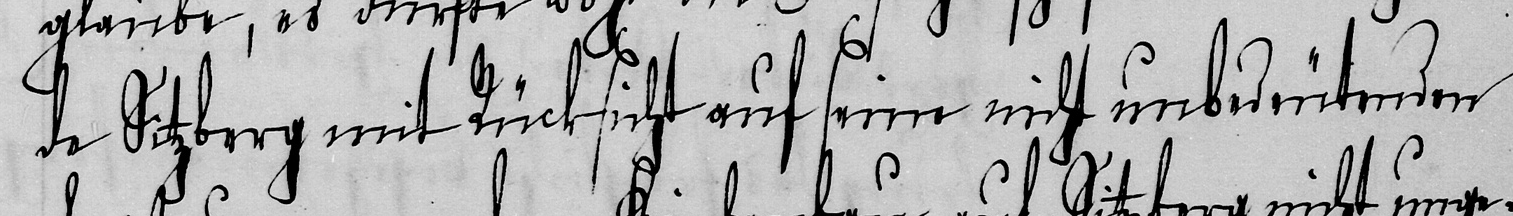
de Sitzberg mit Rücksicht auf seine nicht unbedeutenden
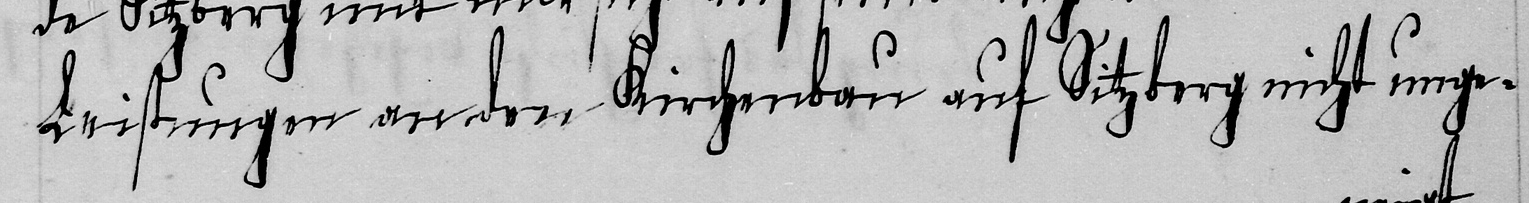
Leistungen an den Kirchenbau auf Sitzberg nicht unge-
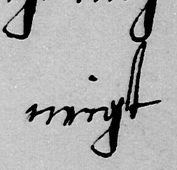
mein¬
